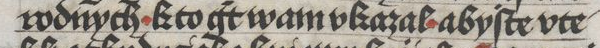rodnych.kto ḡt wam vkazal.abyẛte vte¬
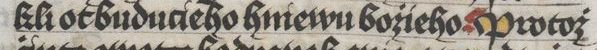kli ot buducieho hniewu božíeho.Protož¬
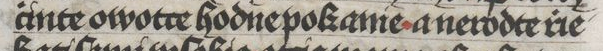ċinte owotce hodne pokaníe.a rerodte ṙie¬
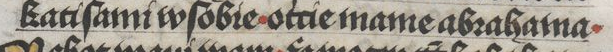kati ſami w ſobie.otcie mame abrahama.
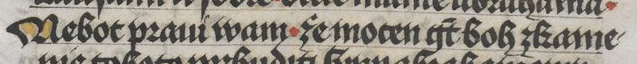Nebot praui wam.że mocen ḡt boh zkame¬
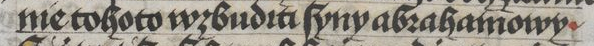níe tohoto wzbuditi ſyny abrahamowy.
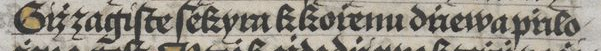Giż zagiſte ſekyra k koṙenu dṙiewa pṙilo¬
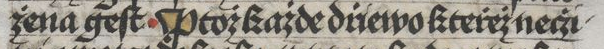żena geſt.Ꝓtoż każde dṙiewo kteṙeż necżi¬
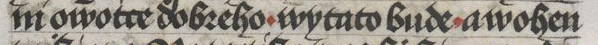ní owotce dobreho.wytato bude.a wohen
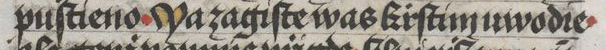puẛtíeno.Ya zagiſte was kṙſtím uwodie.
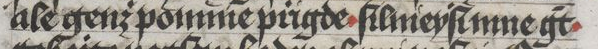ale genż pomnie pṙigde.ſílnieyẛí mne ḡt.
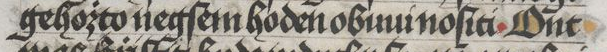gehożto negſem hoden obuui noſiti.Ont
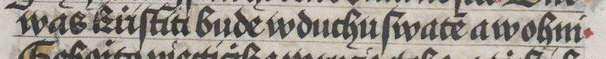was kṙíſtiti bude wduchu ſwatē a wohni.
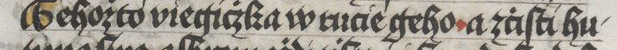Gehożto viegícżka w rucie geho.a zċiſtí hu¬
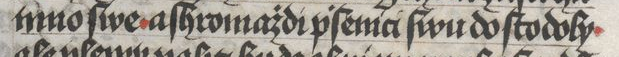mno ſwe.a ſhromażdí pſenici ſwu doſtodoly.
